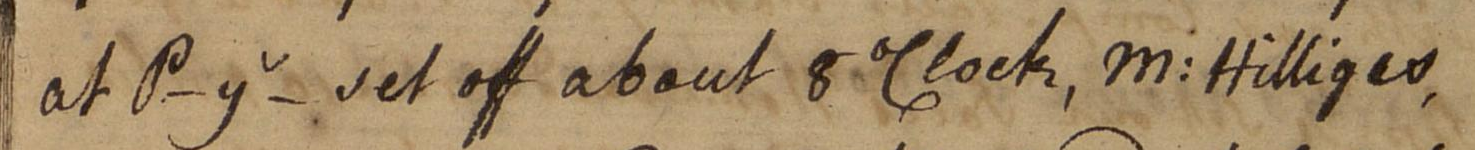at P-y^s- set off about 8 oClock, M: Hilligas,
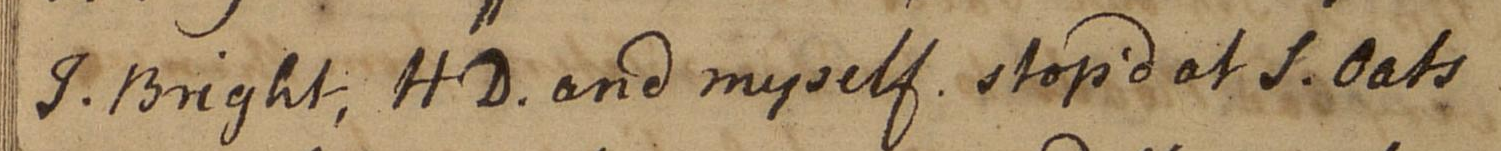I. Bright, HD. and myself stop'd at S. Oats
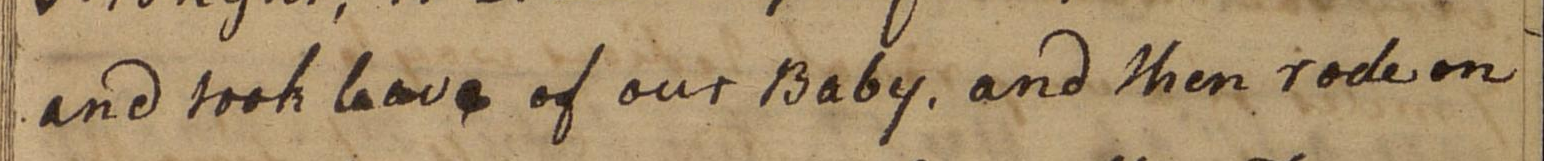and took [leave] of our Baby, and then rode on
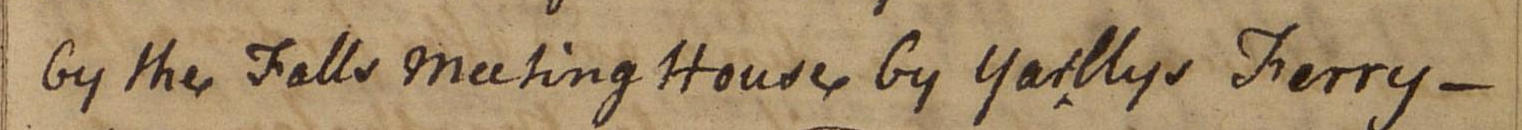by the Falls meeting House by Yarllys Ferry-
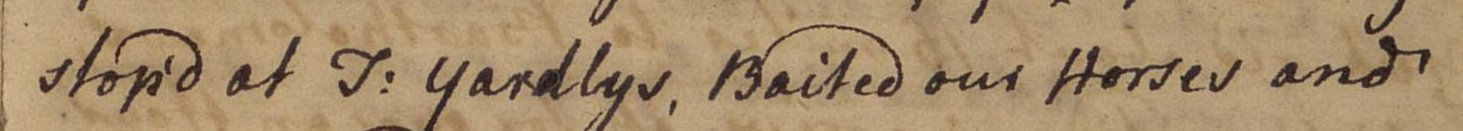stop'd at T: Yardlys, Baited our Horses and
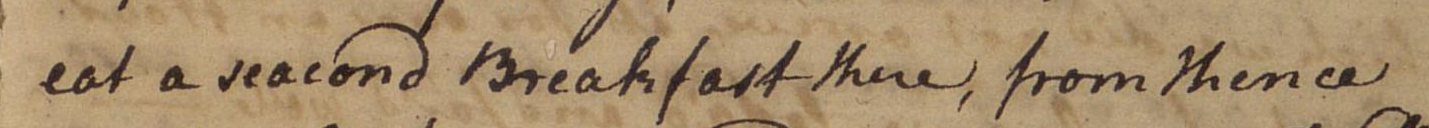eat a seacond Breakfast there, from thence
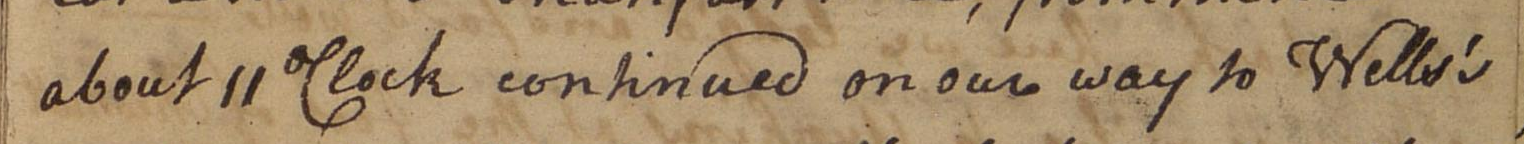about 11 oClock continued on our way to Wells's
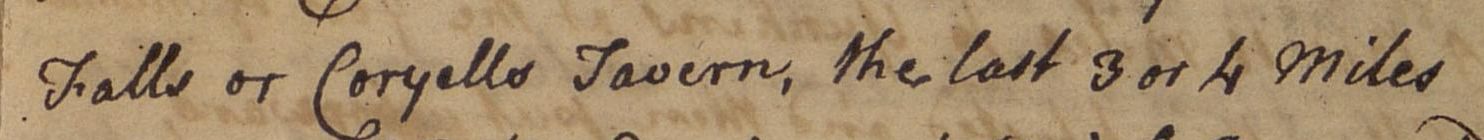Falls or Coryells Tavern, the last 3 or 4 Miles
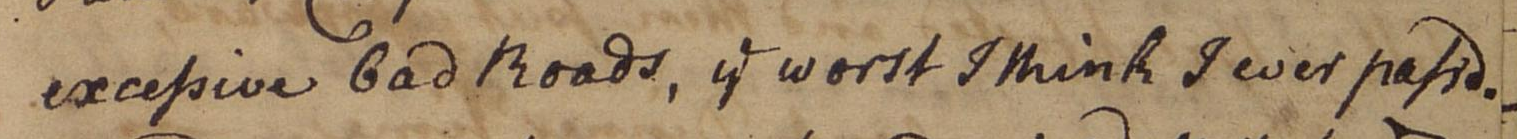excessive bad Roads, y^e worst I think I ever passd.
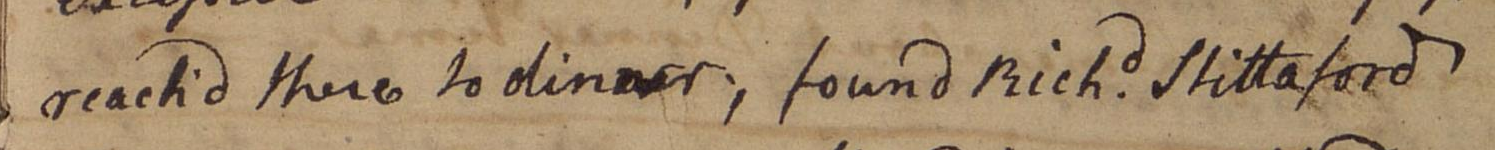reach'd there to din[__]r, found Rich^d. Stittaford
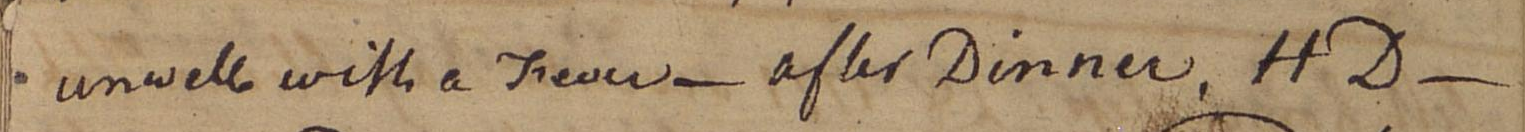unwell with a Fever- after Dinner, HD-
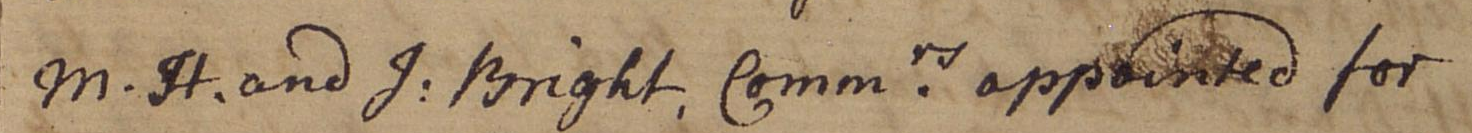M. H. and J: Bright, Comm^rs. appointed for
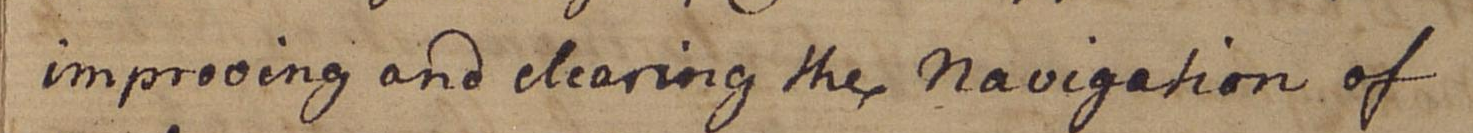improving and clearing the Navigation of
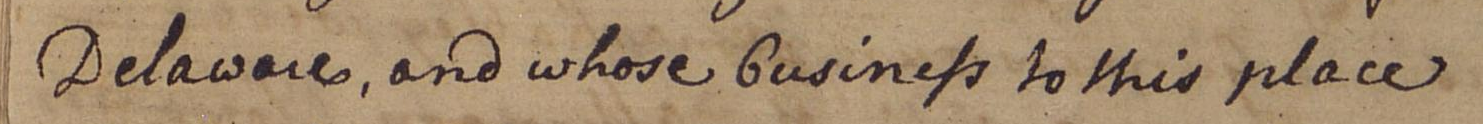Delaware, and whose business to this place
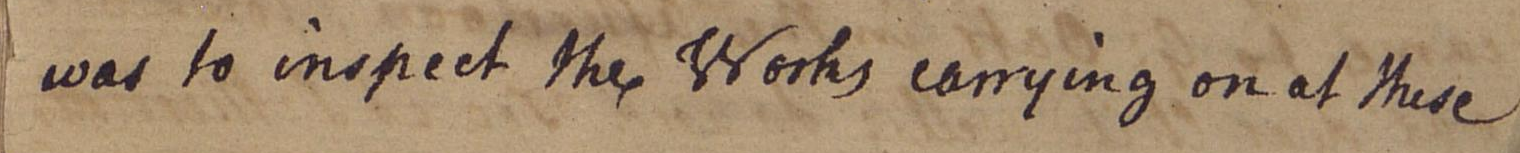was to inspect the Works carrying on at these
